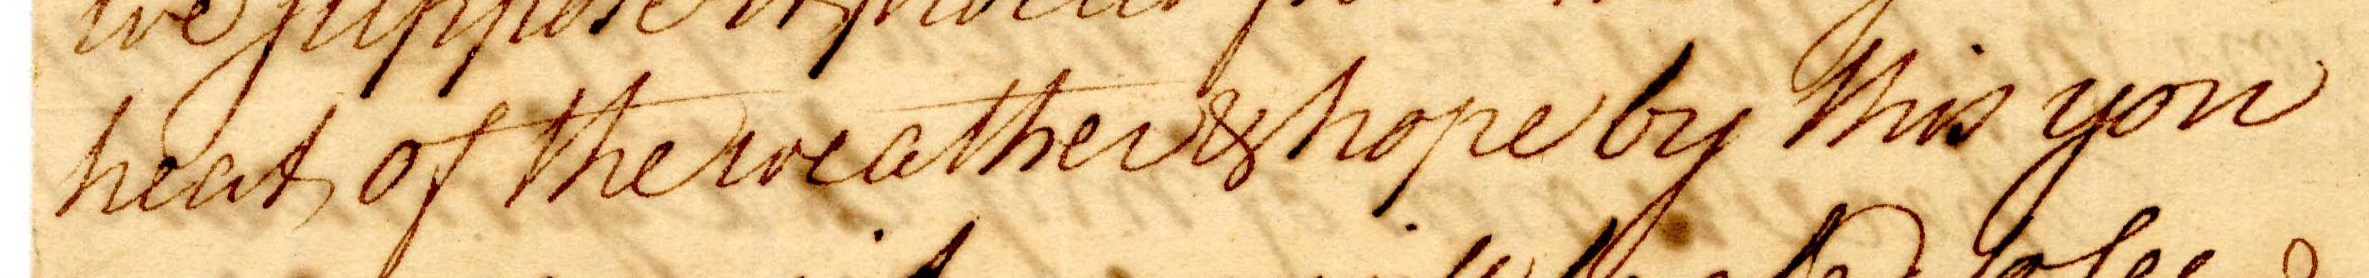heat of the weather & hope by this you
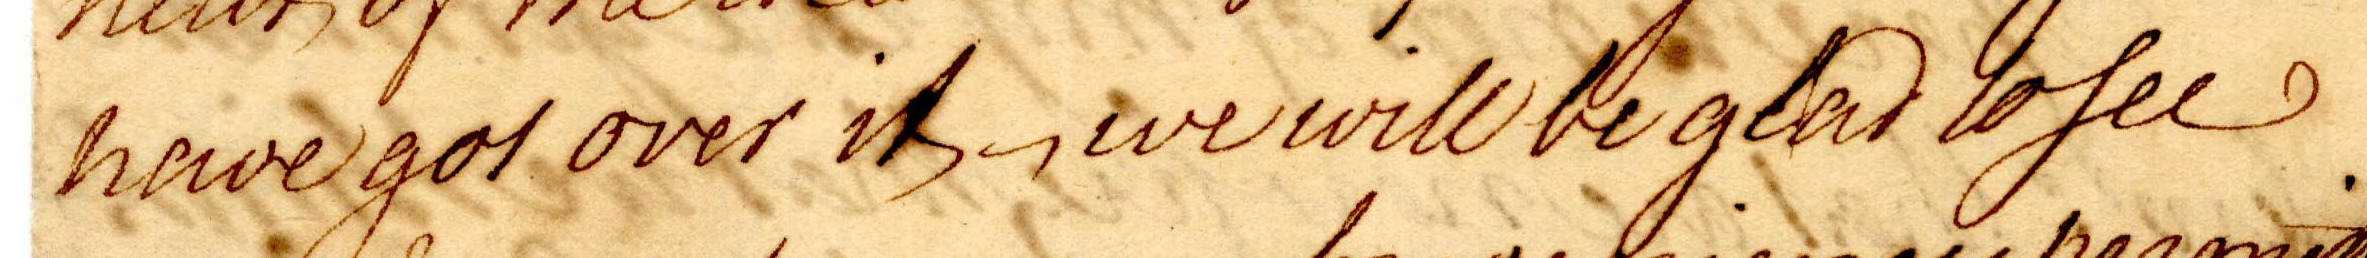have got over it- we will be glad to see
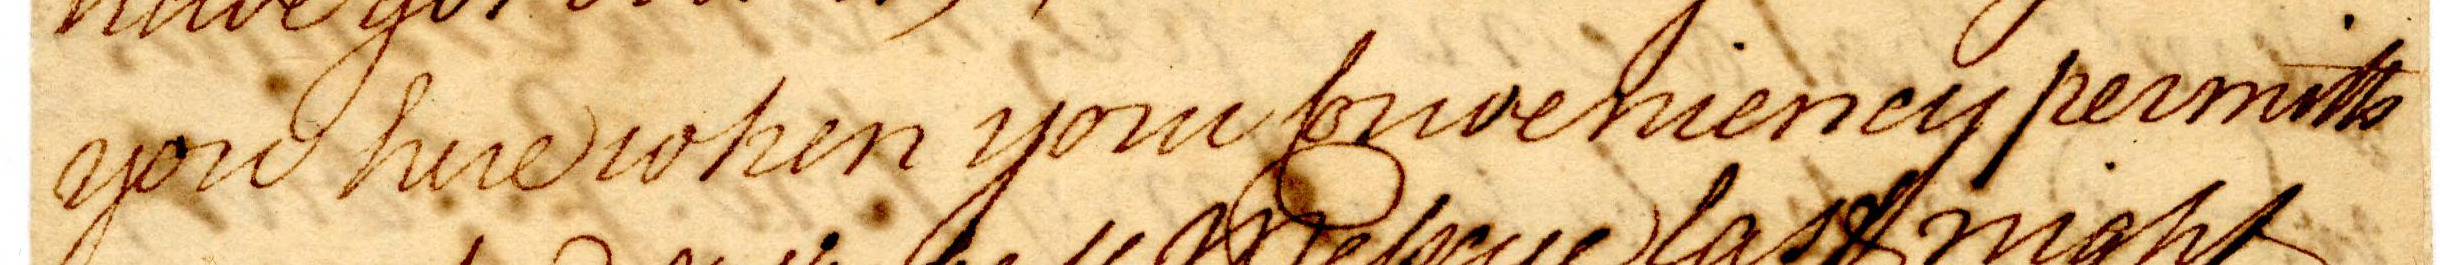you here when your Conveniency permitts
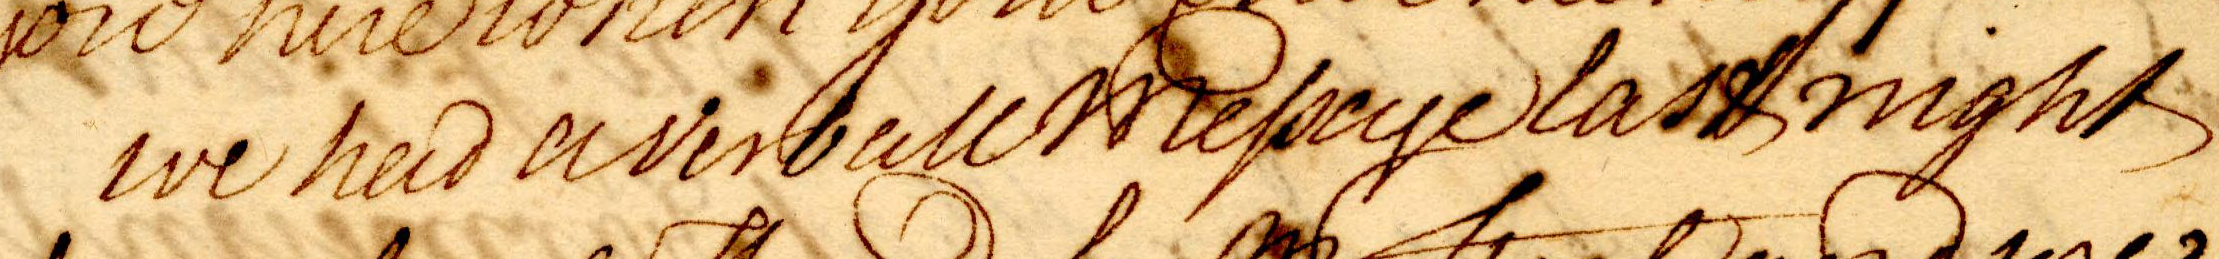We had a verball Message last night
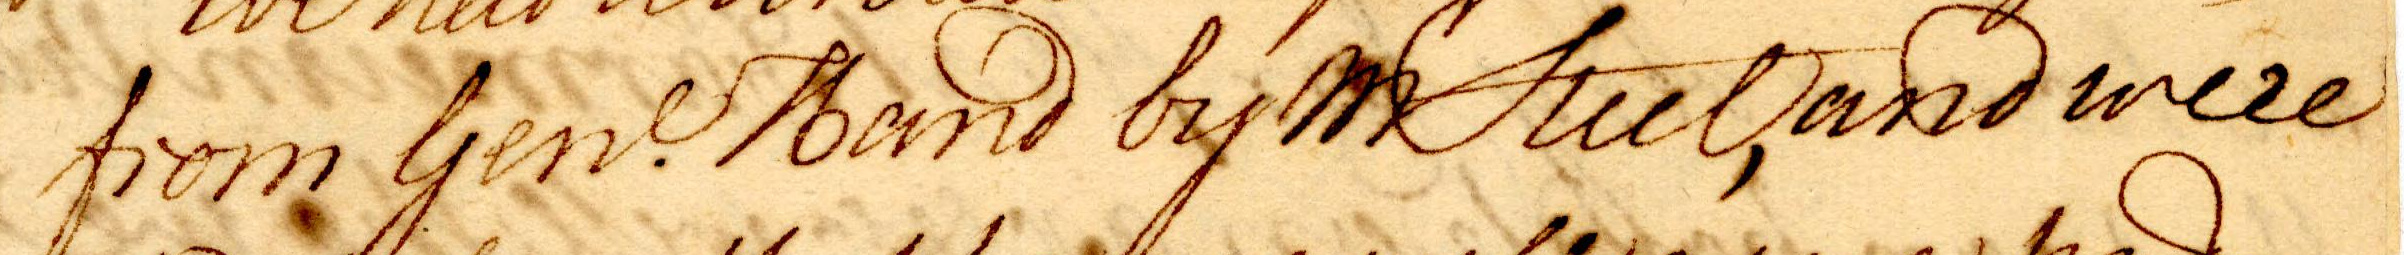from Gen^l. Hand by M^r Steel, and were
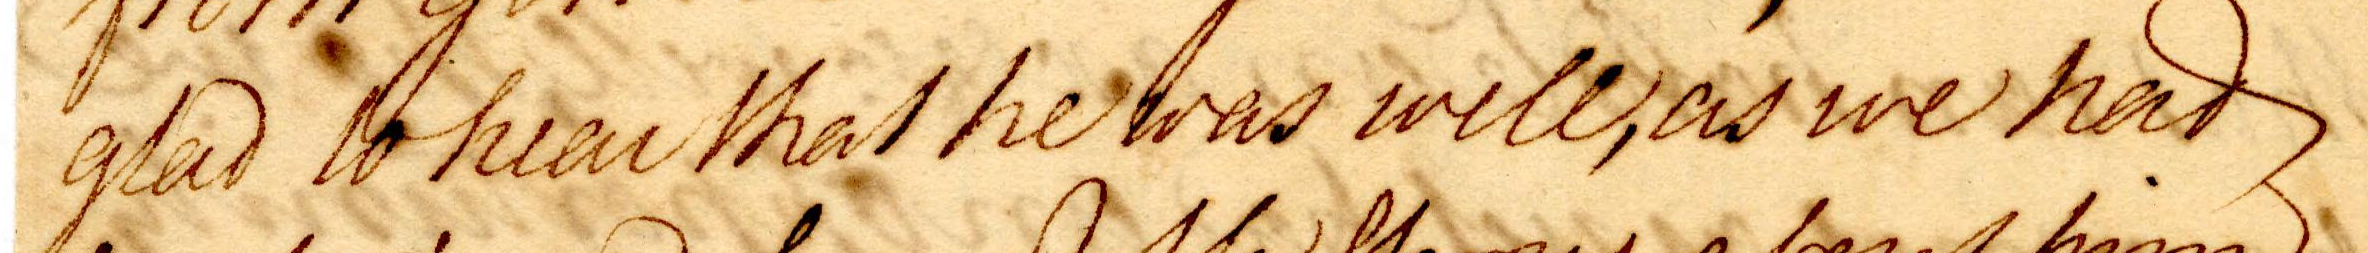glad to hear that he was well, as we had
